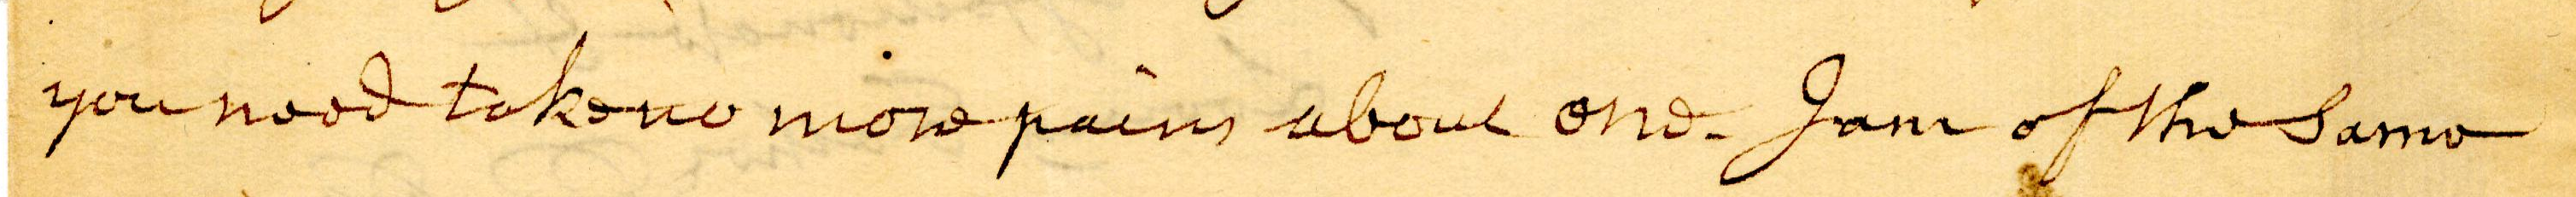you need take no more pains about one- I am of the same
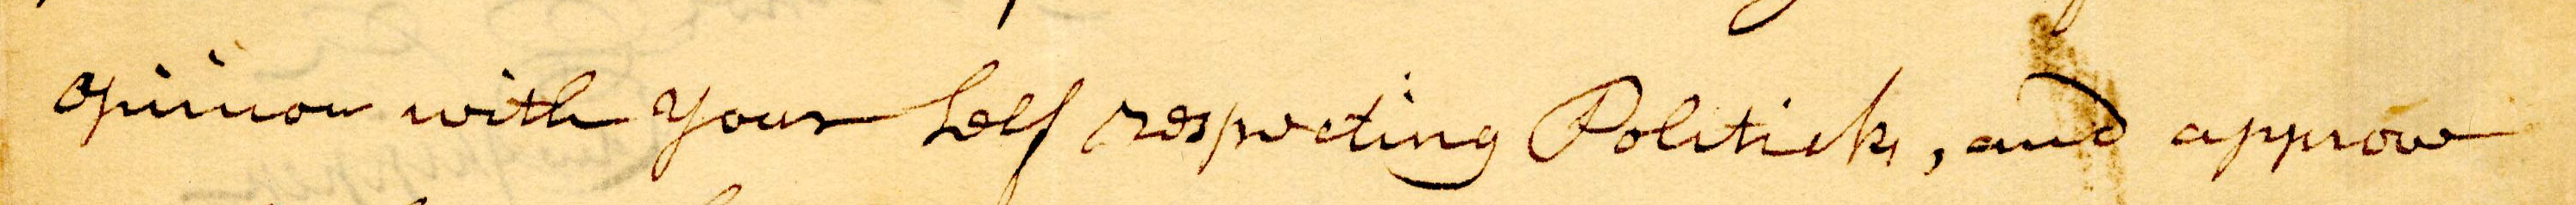opinion with your self respecting Politicks, and approve
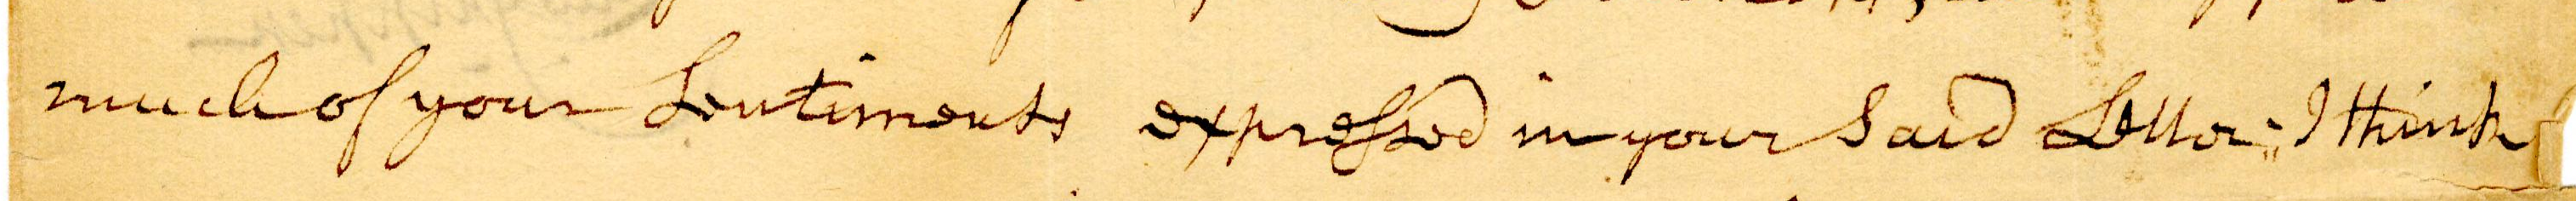much of your sentiments expressed in your said Letter; I think
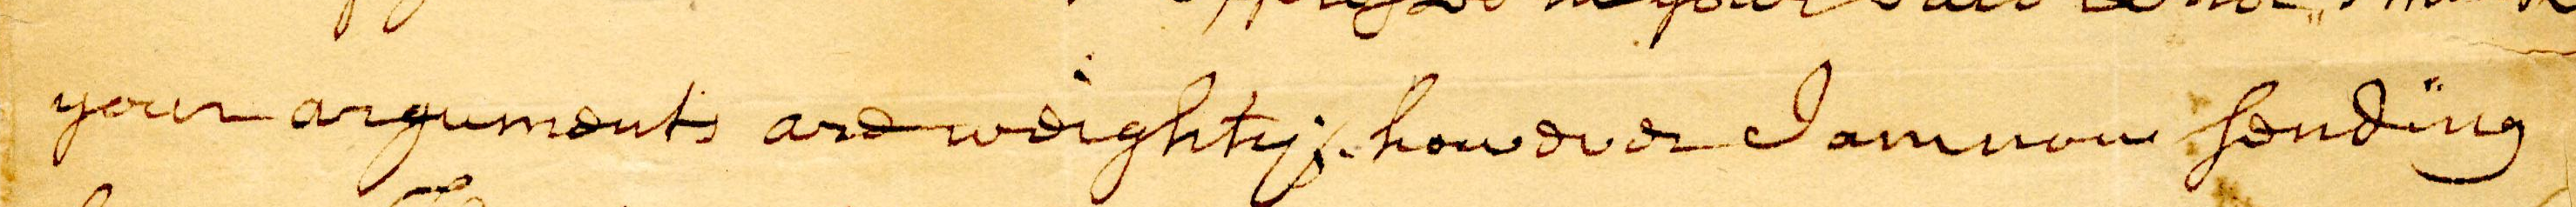your arguments are weighty; however I am now sending
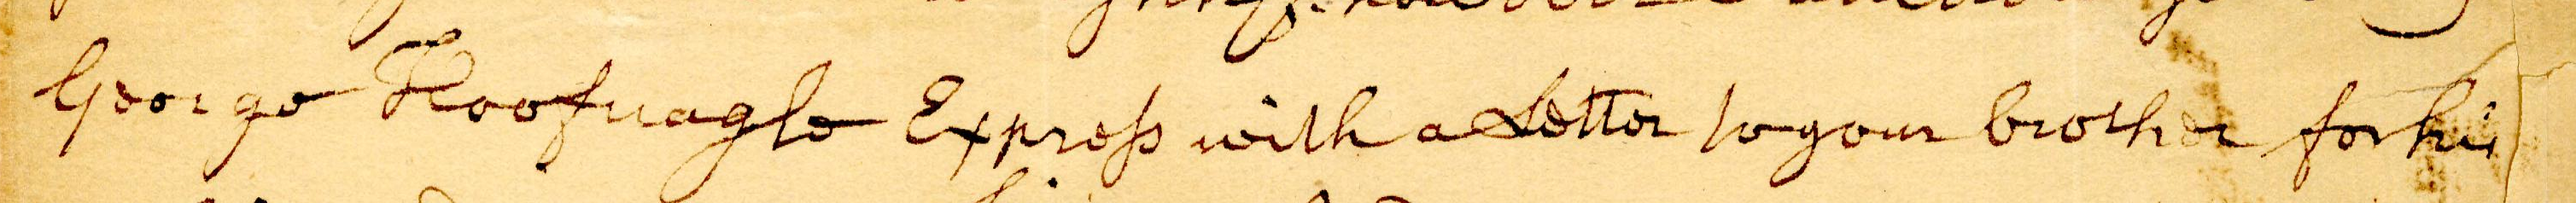George Hoofnagle Express with a Letter to your brother for his
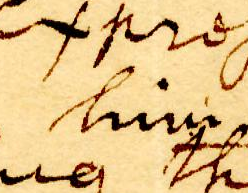him
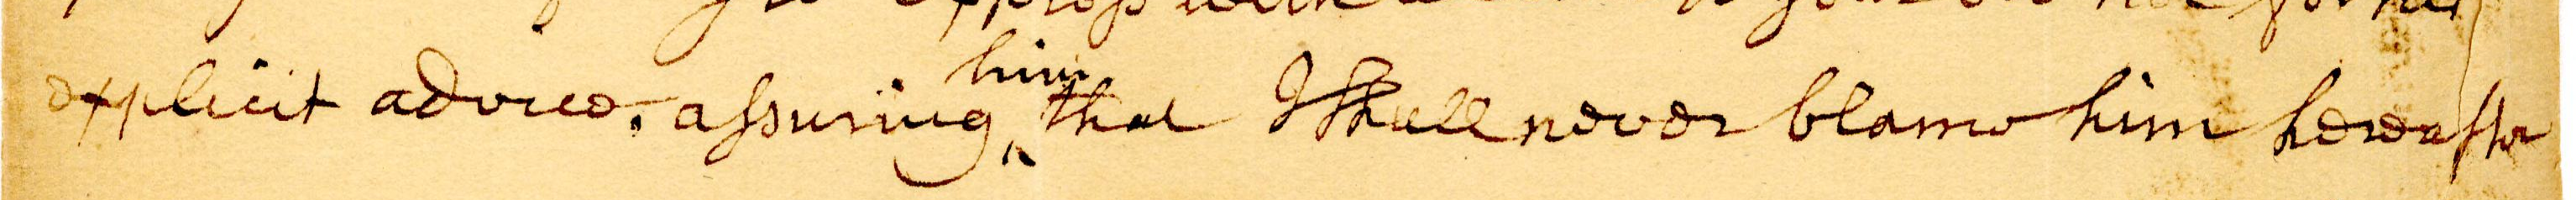explicit advice, assuring ^ that I shall never blame him hereafter
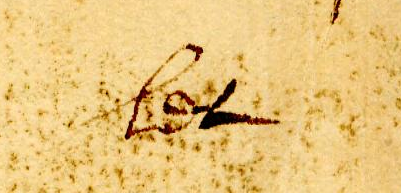let
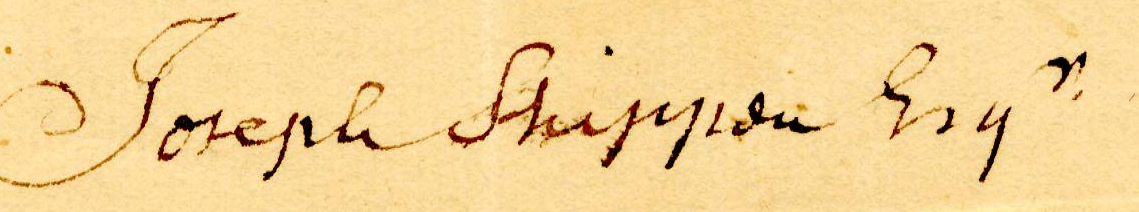Joseph Shippen Esq^r.
